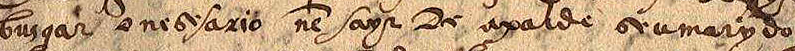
busquar o nesesario nē sayr De a par de seu marydo
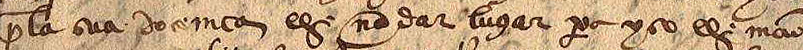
p̄la sua doemca lhe nō dar lugar ꝑa yso lhe maõ
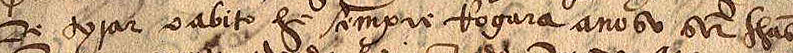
De tyrar o abito he sempre Rogara a noso sor̄ Jhūs
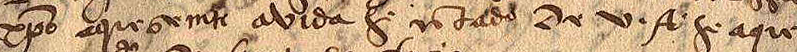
xp̄o aqresemte a vida he estado De V. A. he aqre
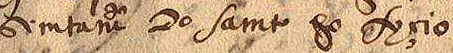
semtamto Do Samto hofyçio
